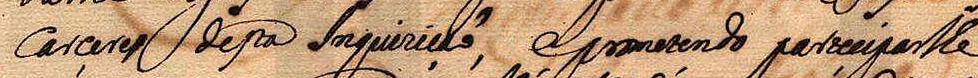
Carceres desta Inquiziçaõ, e prometendo parteciparlhe
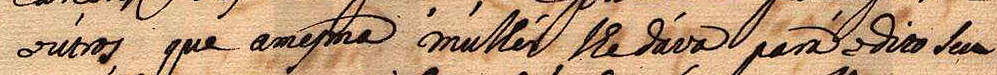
outros, que a mesma mulher lhe dava para o dito seu
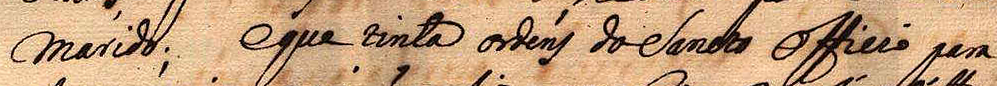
marido; e que tinha orden̄s do Sancto Officio para
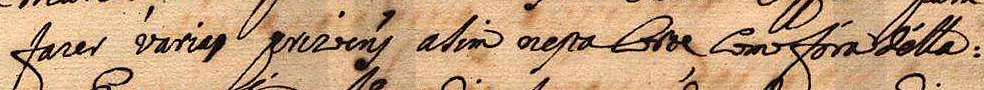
fazer varias prizoen̄s asim nesta Corte Como fora della:
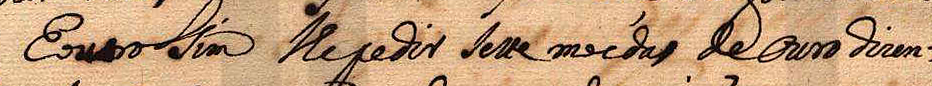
E outrosim lhe pedir sette moedas de ouro dizen
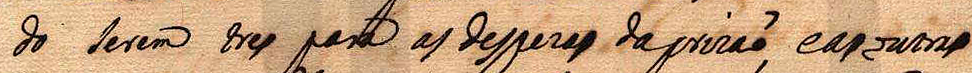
do serem tres para as despezas da prizaõ, e as outras
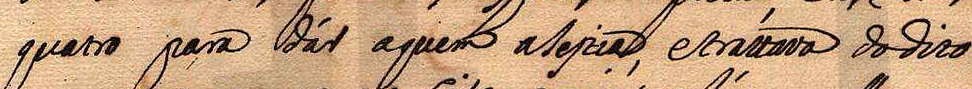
quatro para dar a quem asestia, e trattava do dito
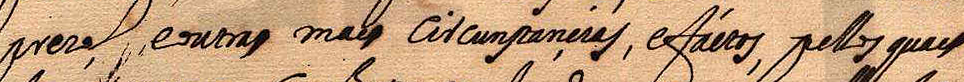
prezo, e outras maes circunstancias, e factos, pellos quaes
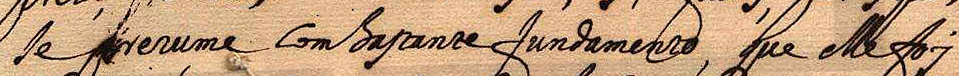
se prezume com bastante fundamento, que elle foj
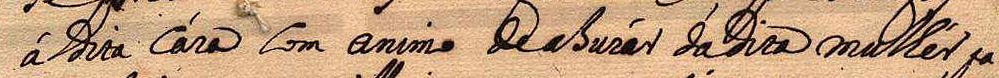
á dita Caza Com animo de abuzar da dita mulher, pa
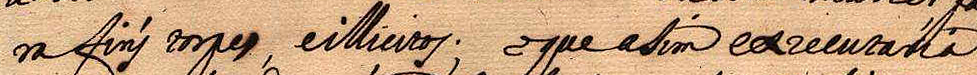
ra fin̄s torpes, e illicitos; e que asim exzecutaria
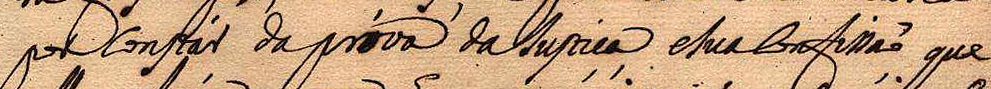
por Constar da prova da Iustiça, e sua Confissaõ que
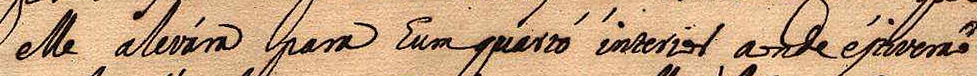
elle a levara para hum quarto interior, aonde estiveraõ
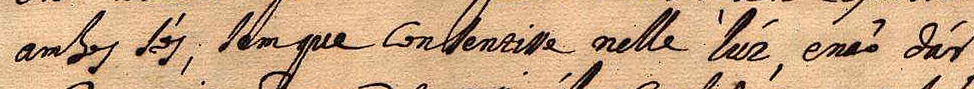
ambos sós, sem que consentisse nelle luz̄, e naõ dar
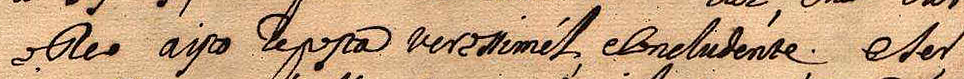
o Reo a isto Reposta verossimeL, e Concludente; e ser
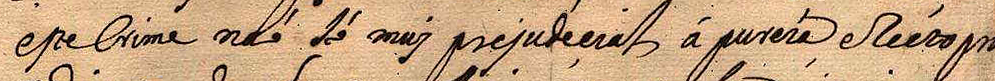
este Crime naõ só muj prejudecial á pureza, e Recto pro
